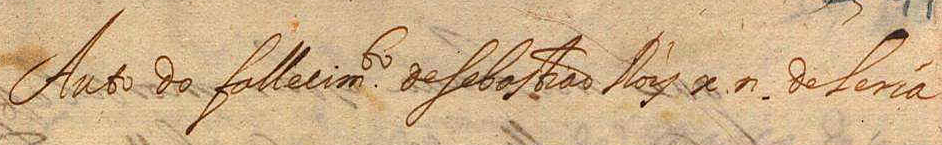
Auto do fallecim.to de sebastião Roīs x. n. de Leria
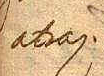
atraz.
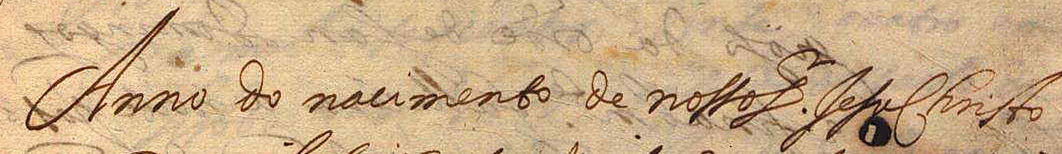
Anno do nacimento de nosso s.r Jesu Christo
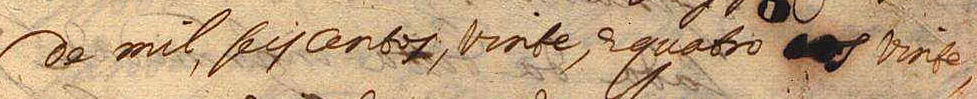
de mil, seiscentos, vinte, E quatro aos vinte,
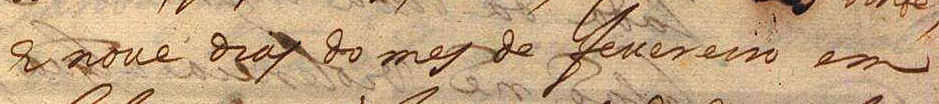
E noue dias do mes de feuereiro em
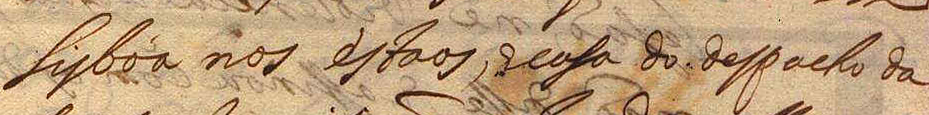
Lisboa nos estaos, E casa do despacho da
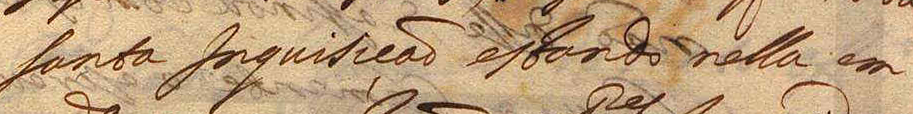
santa Jnquisição estando nella em
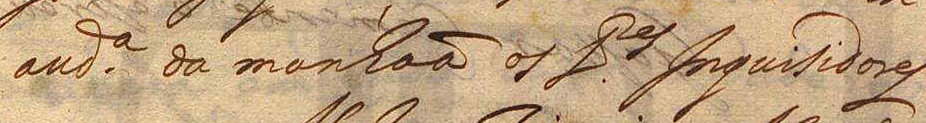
aud.a da manhaã os s.res Jnquisidores
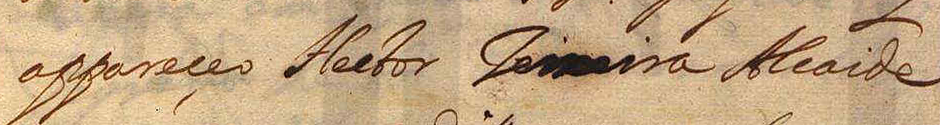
appareçeo Hector Teixeira Alcaide
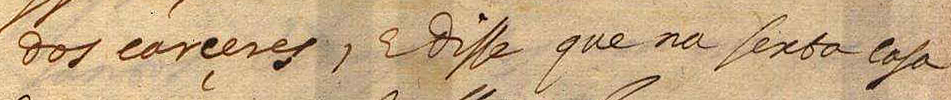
dos carçeres, E disse que na sexta casa
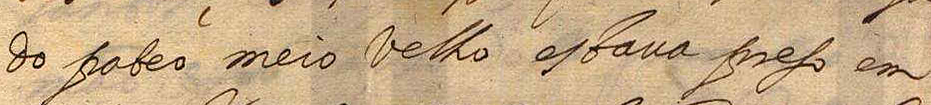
do pateo meio velho estaua preso em
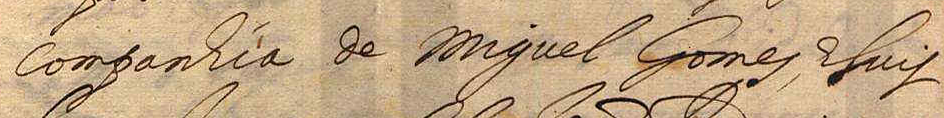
companhia de miguel Gomes, E Luis
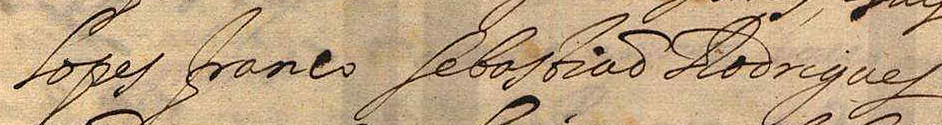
Lopes franco sebastiaõ Rodrigues
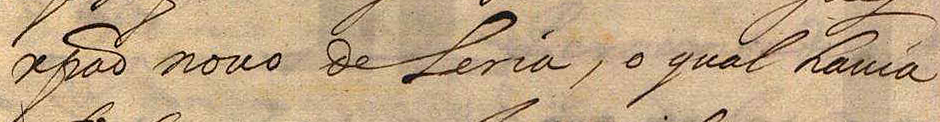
xpão nouo de Leria, o qual hauia
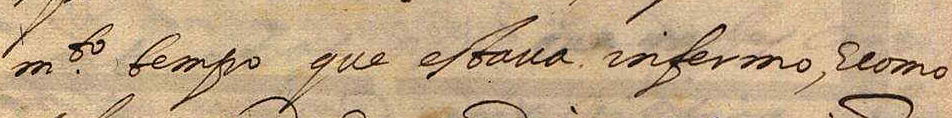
m.to tempo que estaua infermo, E como
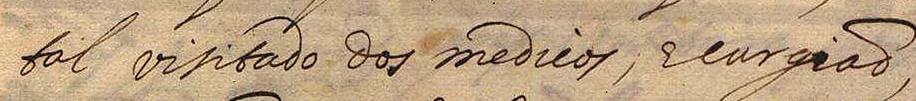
tal visitado dos medicos, E curgiaõ,
